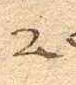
20
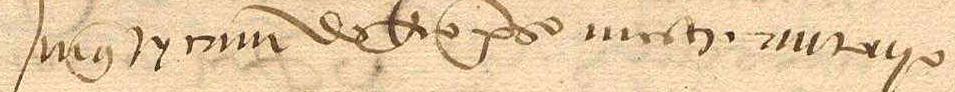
Jmq̄rycam do Reo p̄so mestre antonjo
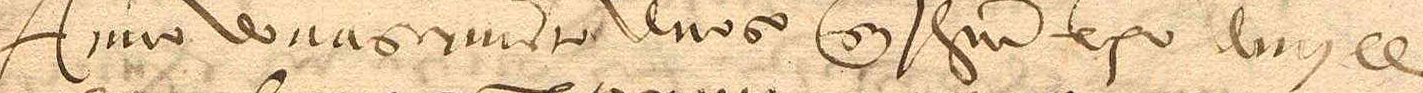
Anno do nascymēto de noso s̄r Jhuū xp̄o de mjll
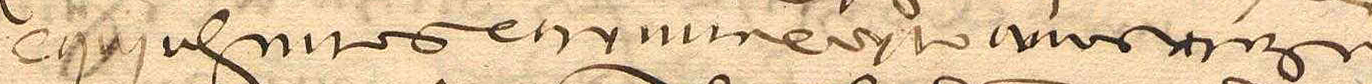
e qujnhentos e trymta e oyto anos treze
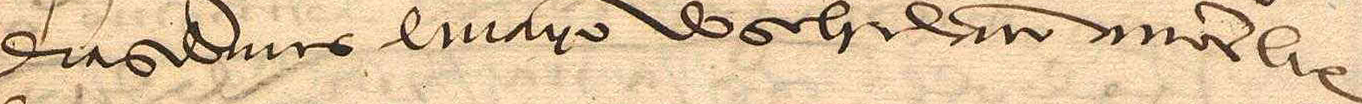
dias do mes de mayo do sobredit̄o ano ē lix
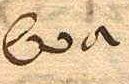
boa
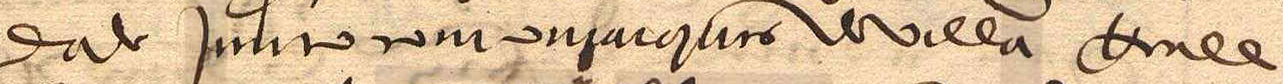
dade Junto com o marquēs de villa Reall
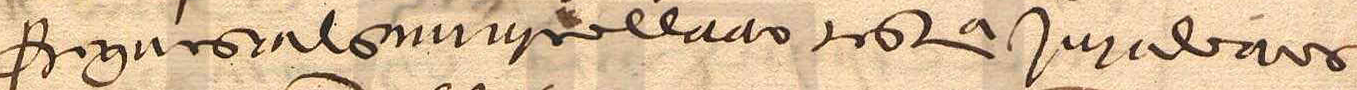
frequesya de sam njcollaao testa Jurado aos
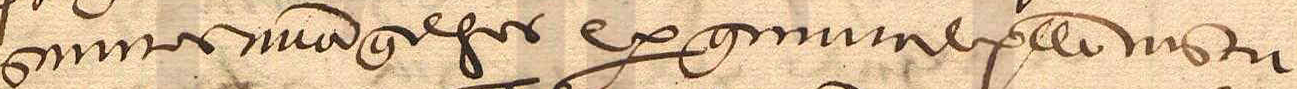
samtos auāgelhos e ꝑgumtado pl̄lo custu
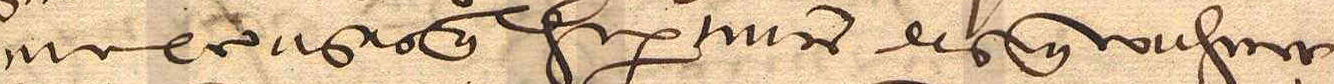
me e cousas q̄ lhe ꝑtencē dise q̄ conheçe
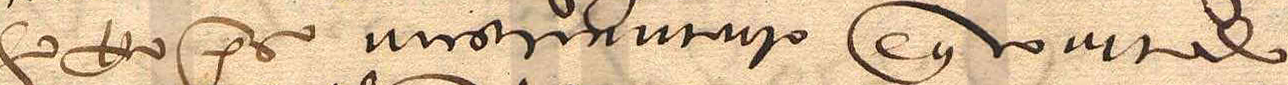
ho Reo p̄so mestre antonjo e q̄ comtodo
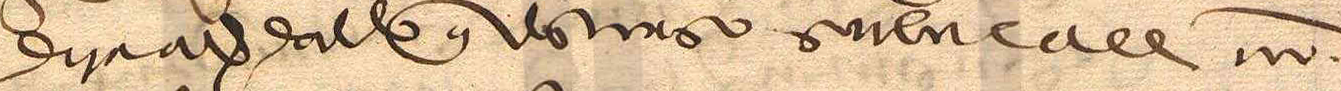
dira a ꝟdade do q̄ do seu caso souber e all n̄o
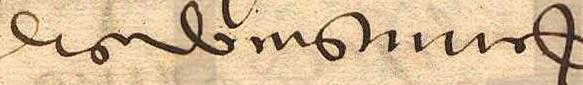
dise do custume
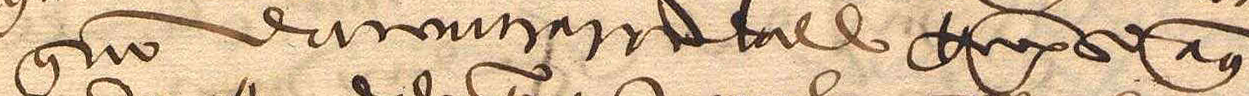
guo da comtraryedade do Reo p̄so a q̄
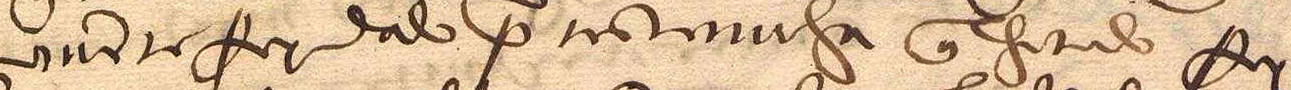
somēte foy dado p̄o testemunha q̄ lhe todo foy
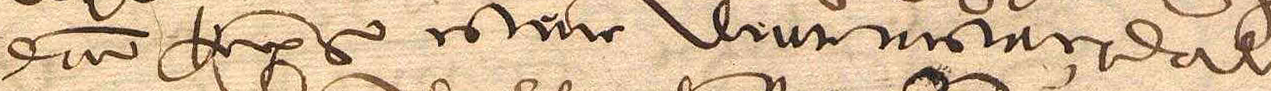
dīto Reo p̄so esteue doente nesta çydade
